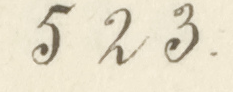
523.
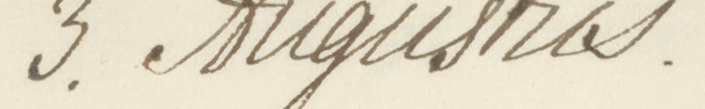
3. Augustus.
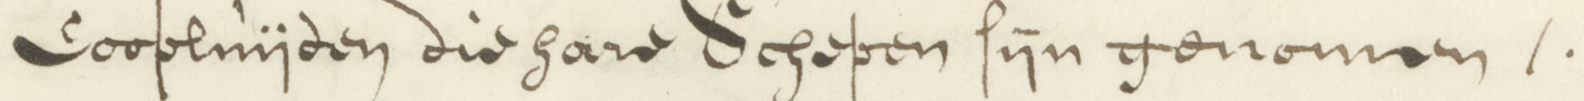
Coopluijden die hare Schepen sijn genomen.
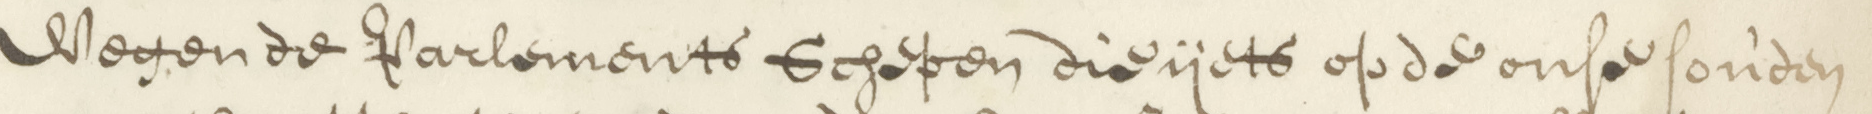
Wegen de Parlements Schepen die ijets op de onse souden
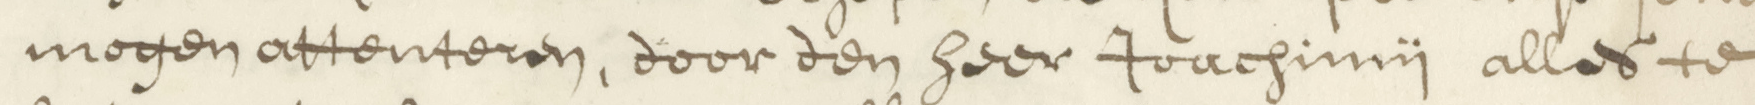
mogen attenteren, door den heer Joachimij alles te
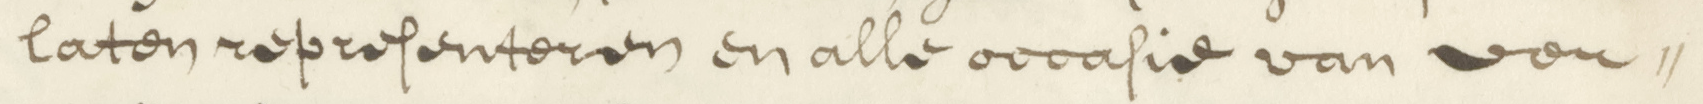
laten representeren en alle occasie van ver„
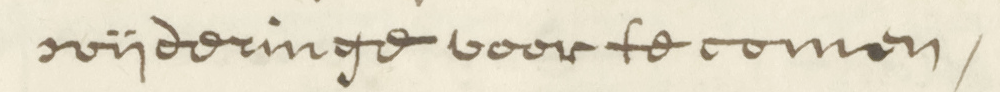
wijderinge voor te comen.
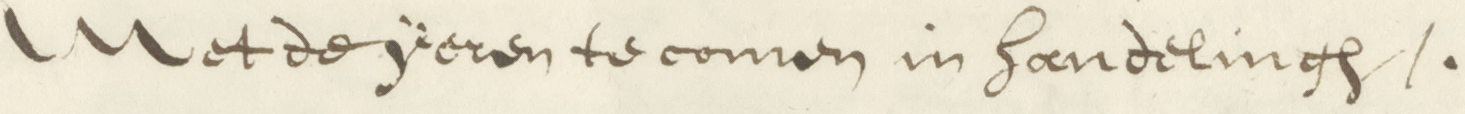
Met de ijeren te comen in handelingh.
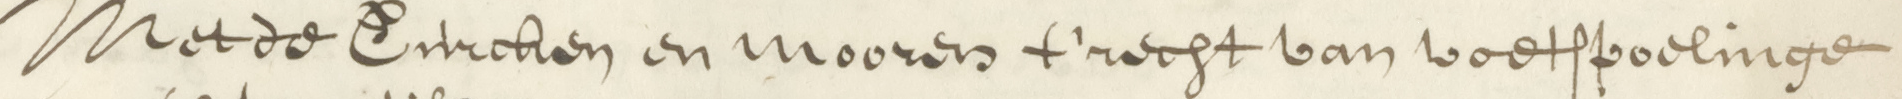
Met de Turcken en mooren t'recht van voetspoelinge
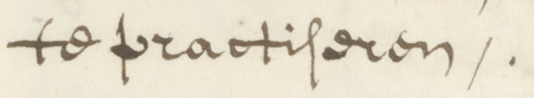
te practiseren.
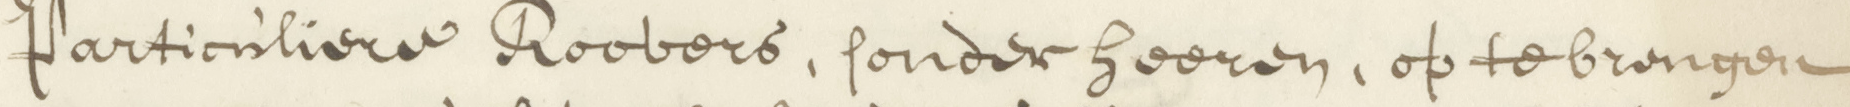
Particuliere Roovers, sonder heeren, op te brengen
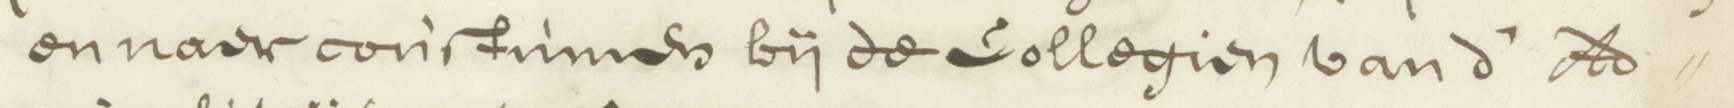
en naer coustumen bij de Collegien van d'Ad„
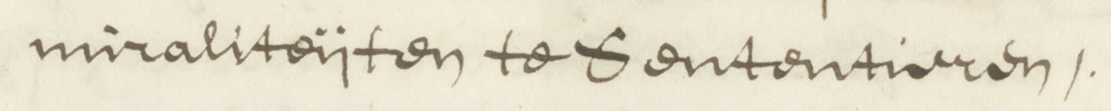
miraliteijten te Sententieren.
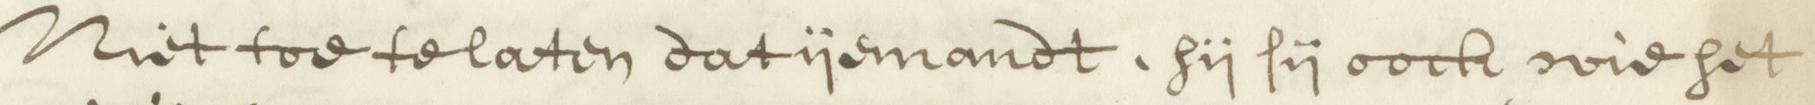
Niet toe te laten dat ijemandt, hij sij oock wie het
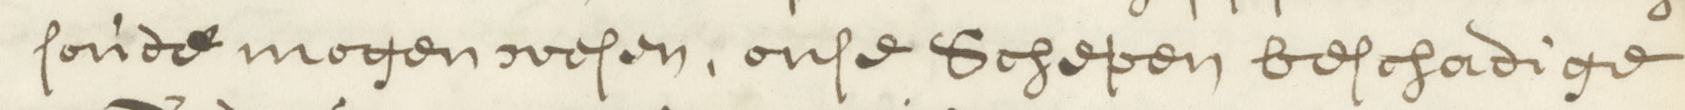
soude mogen wesen, onse Schepen beschadige
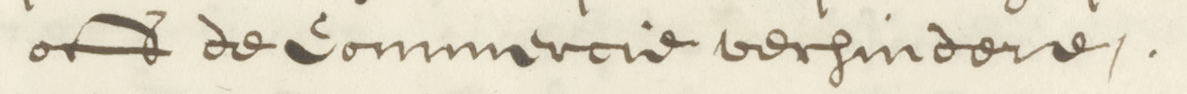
off de Commercie verhindere.
